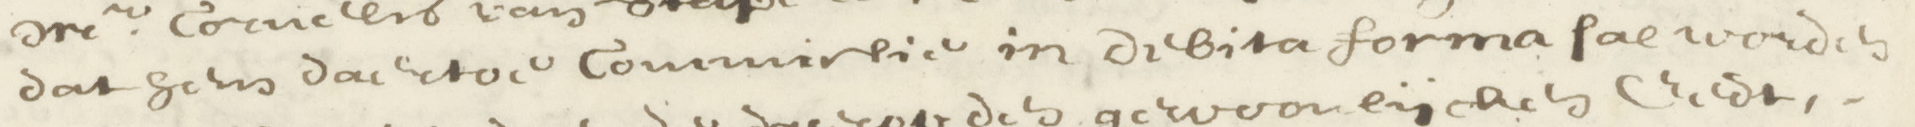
dat hem daertoe commissie in debita forma sal worden
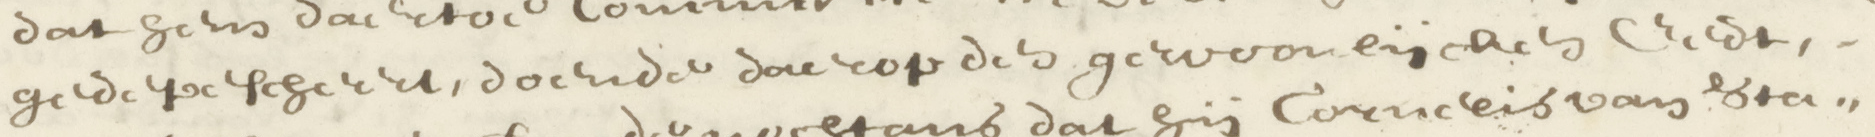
gedepescheert, doende daerop den gewoonlijcken Eedt, -
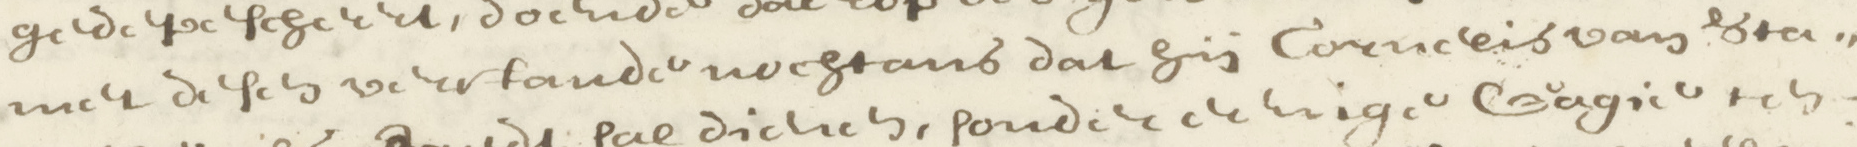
met desen verstande nochtans dat hij Cornelis van Sta„
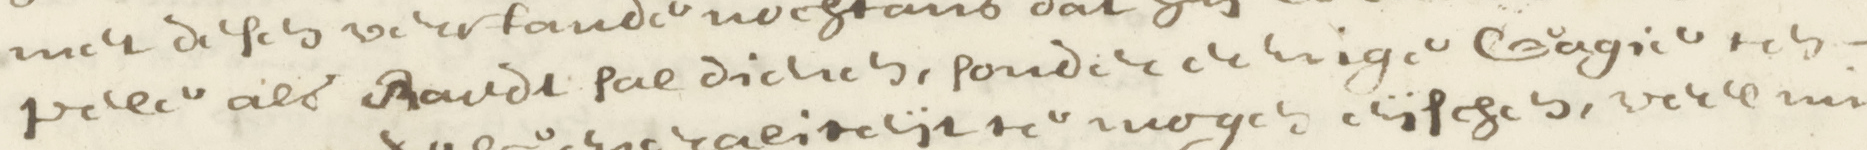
pele als Raedt sal dienen, sonder eenige Gagie ten -
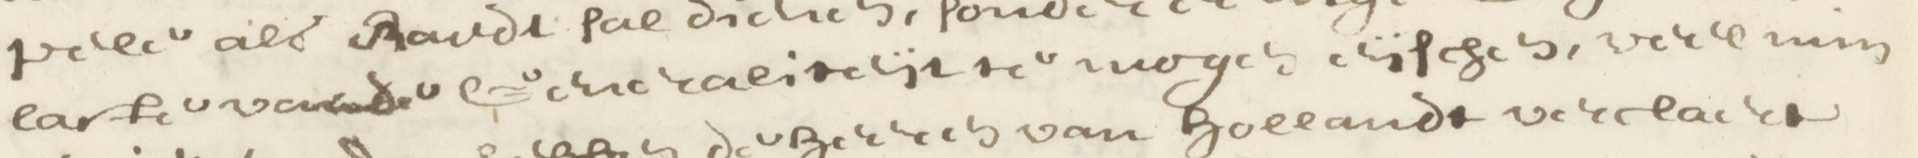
laste van de Generaliteijt te mogen eijschen, veel min
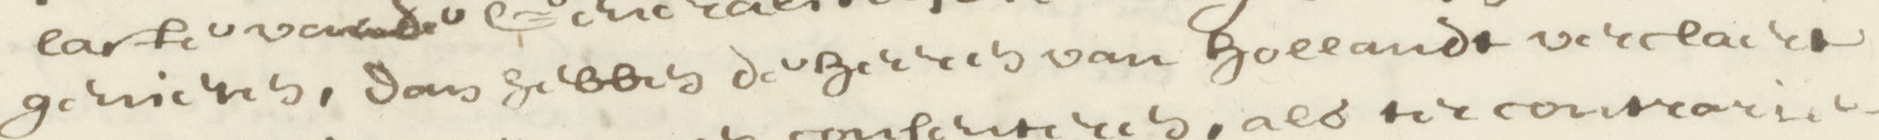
genieten, dan hebben de heeren van Hollandt verclaert
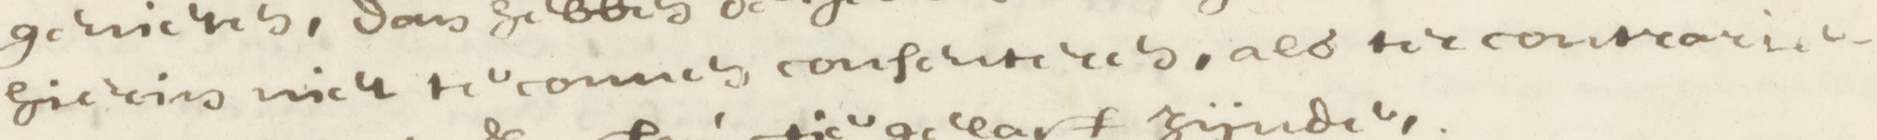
hierin niet te connen consenteren, als ter contrarie
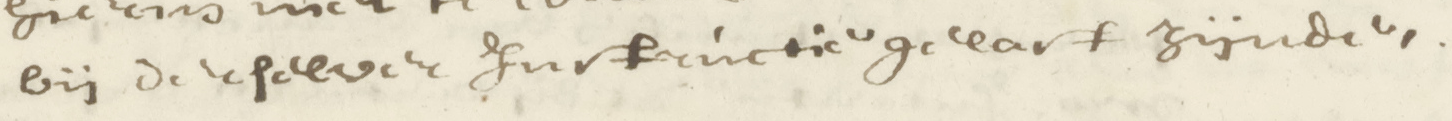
bij derselver Instructie gelast zijnde.
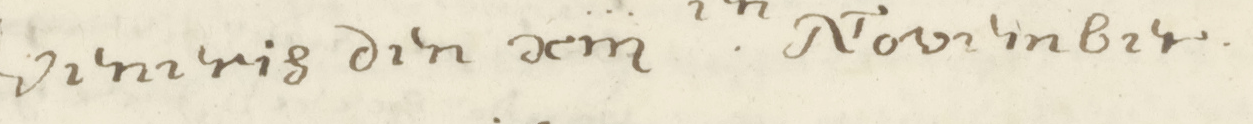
Veneris den xiiien November
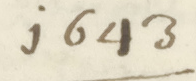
1643
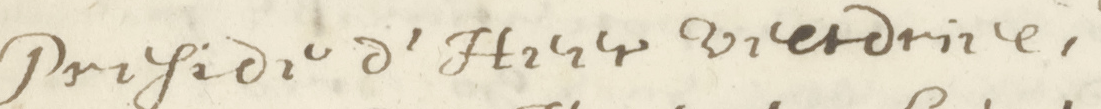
Preside d'Heer Veltdriel,
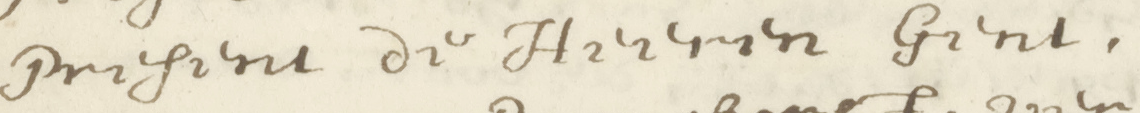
present de Heeren Gent,
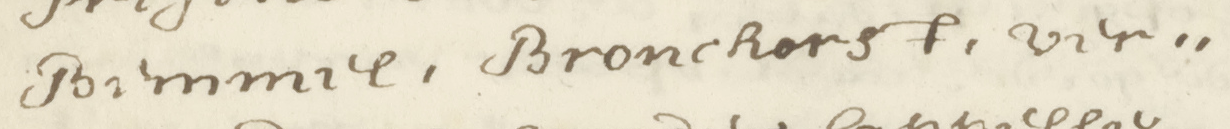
Bemmel, Bronchorst, Ver„
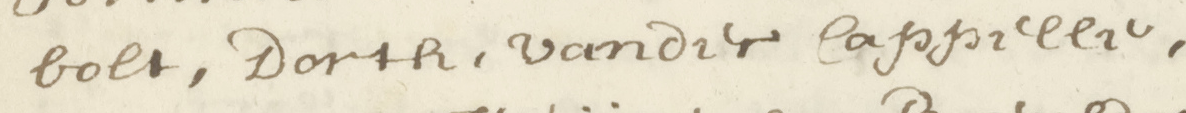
bolt, Dorth, van der Cappelle,
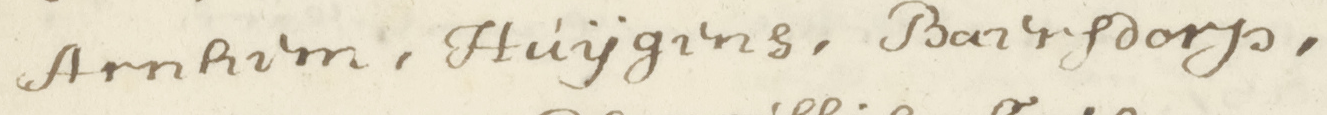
Arnhem, Huijgens, Baersdorp,
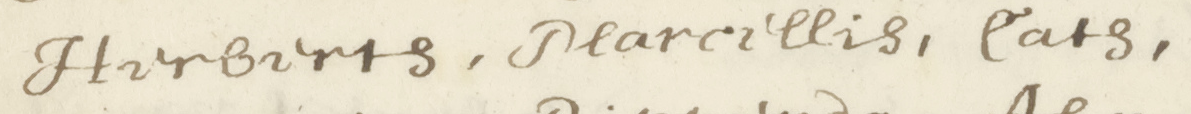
Herberts, Marcellis, Cats,
